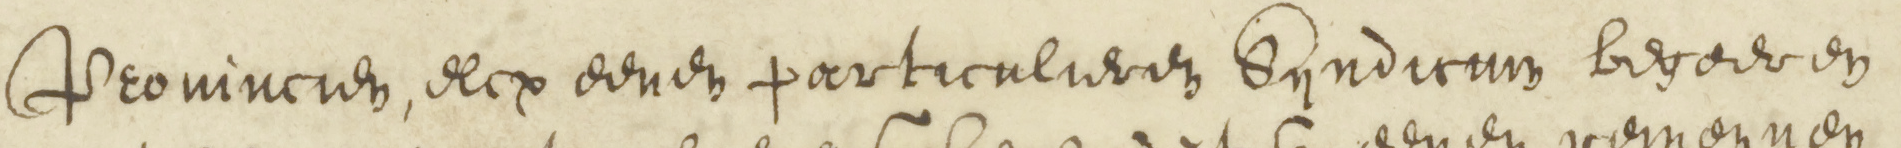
Prouincien, elcx eenen particulieren Syndicum begeeren
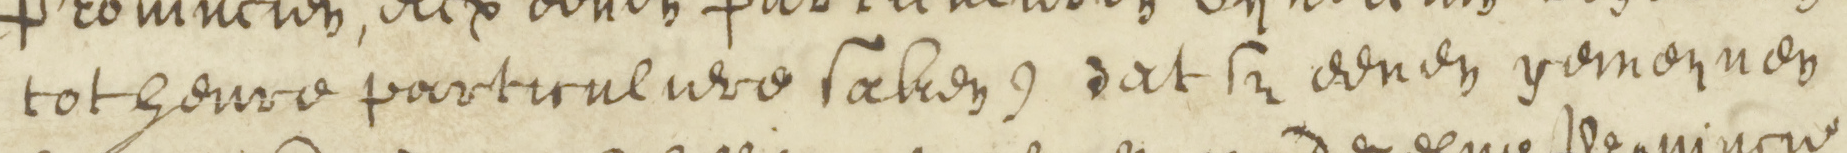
tot heure particuliere saken & dat sy eenen gemeynen
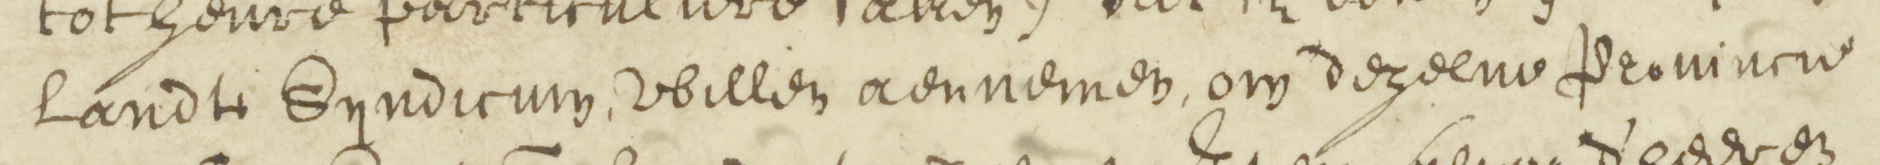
landts Syndicum willen aennemen, om dezelue Prouincie
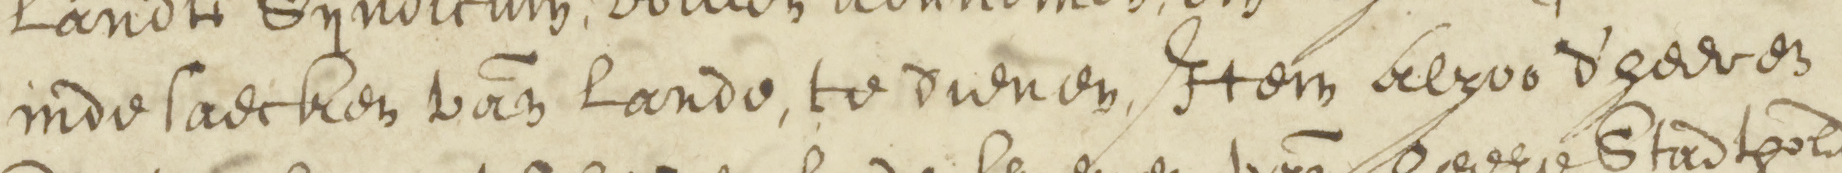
inde saecken van lande, te dienen. Item alszoo d'heeren
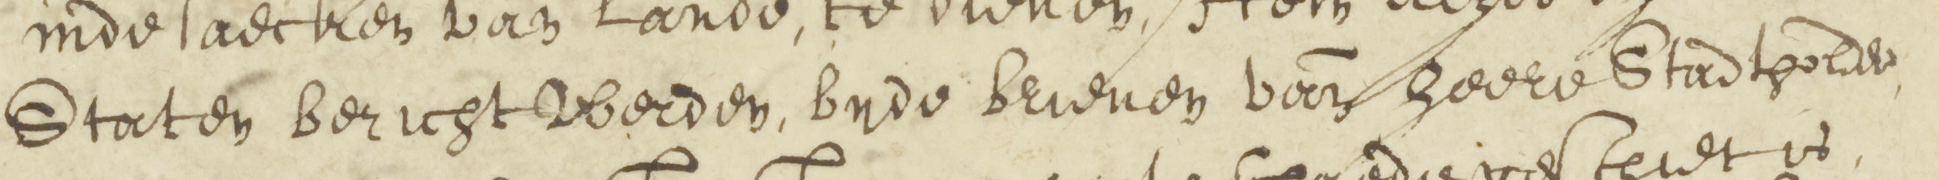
Staten bericht werden, byde brieuen van heere Stadtholder,
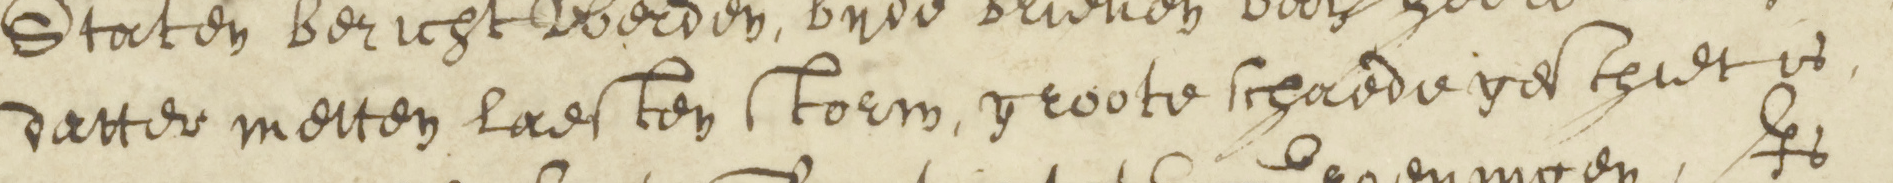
datter metten laesten storm, groote schaede geschiet is,
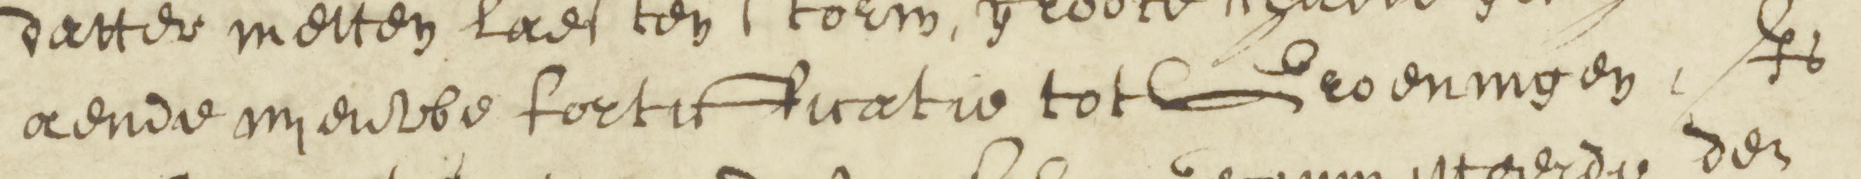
aende nyeuwe fortifficatie tot Groeningen. Is
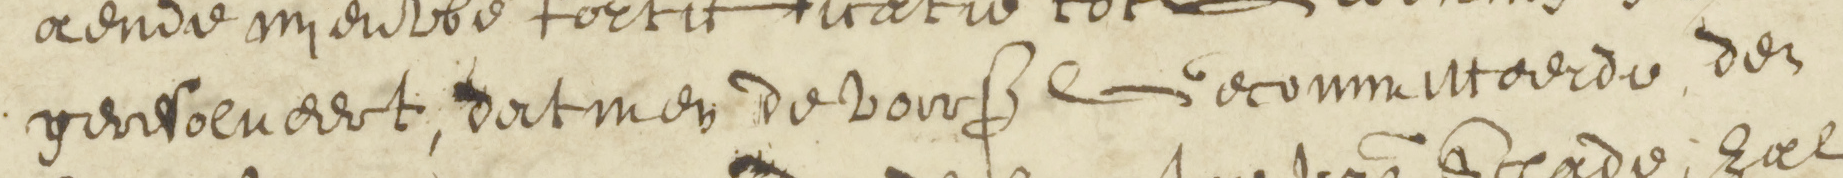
geresolueert, dat men de voirs Gecommitteerde den
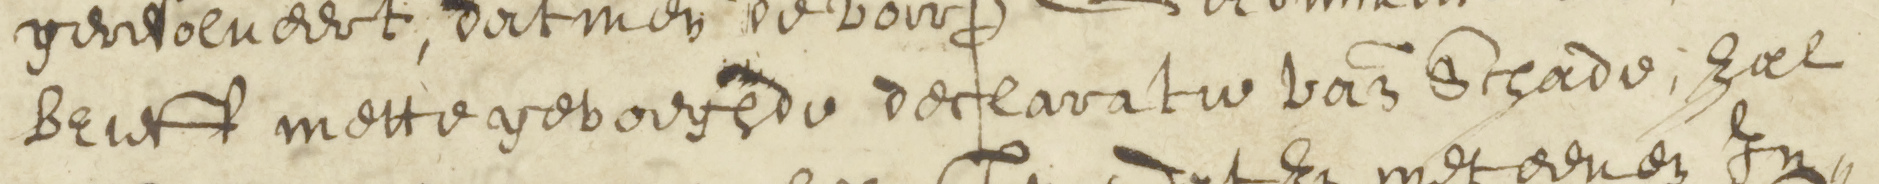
brieff mette gevoeghde declaratie van Schade, zal
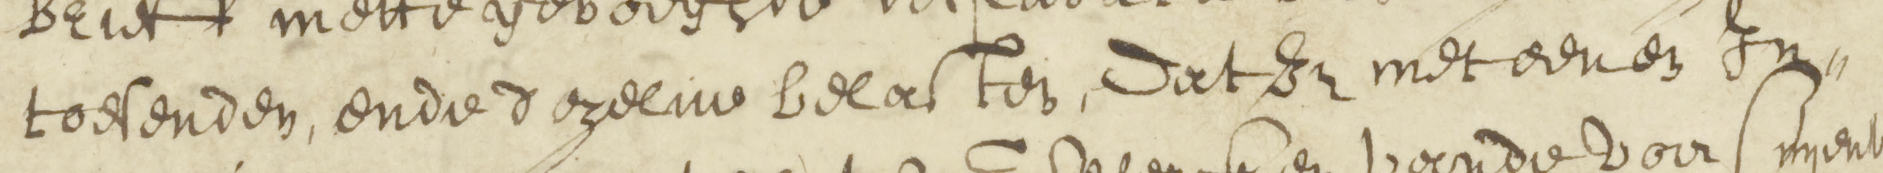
toesenden, ende dezelue belasten, dat zy met eenen In,,
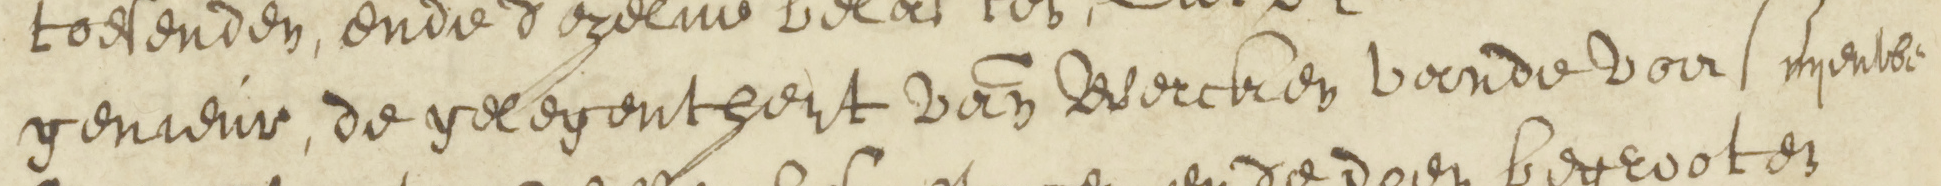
genieur, de gelegentheyt van wercken van die voirs nyeuwe
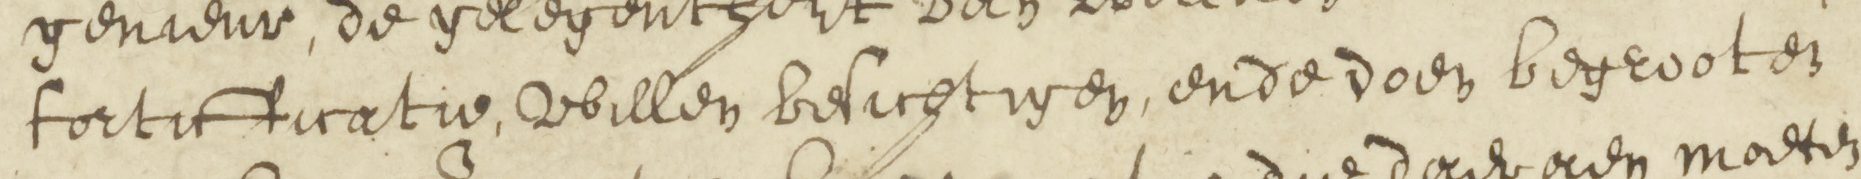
fortifficatie, willen besichtigen, ende doen begrooten
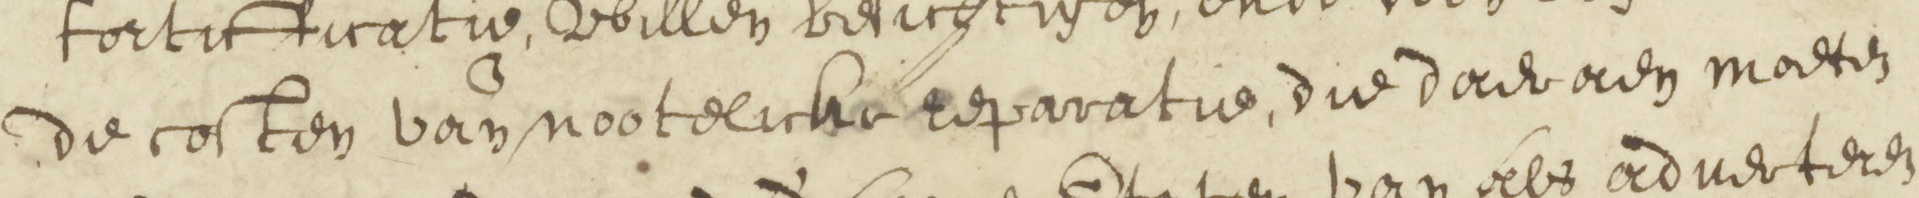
de costen van nootelicke reparatie, die daer aen moeten
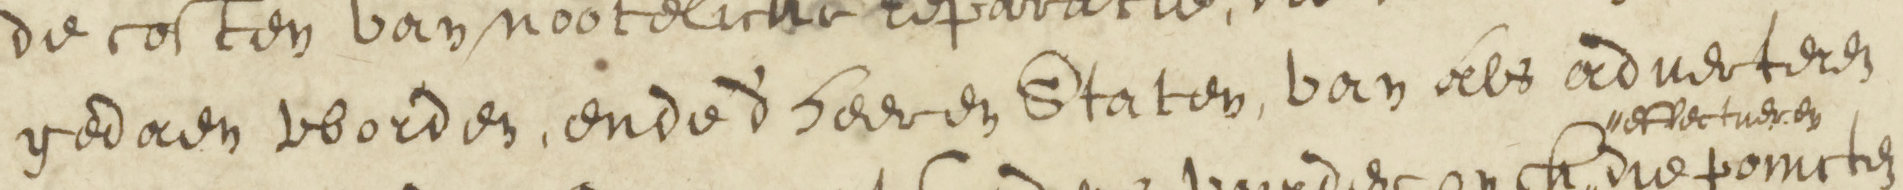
gedaen worden, ende d'heeren Staten van als aduerteren
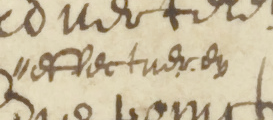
,,effectueren
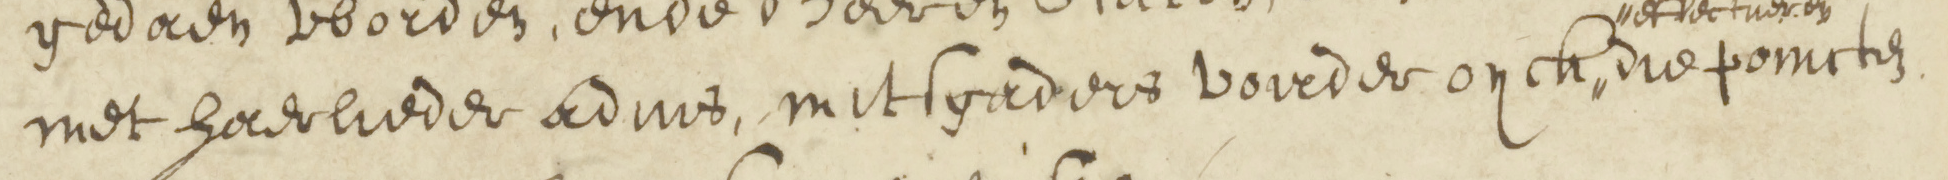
met haerlieder aduis, mitsgaders voirder oyck,,die poincten
